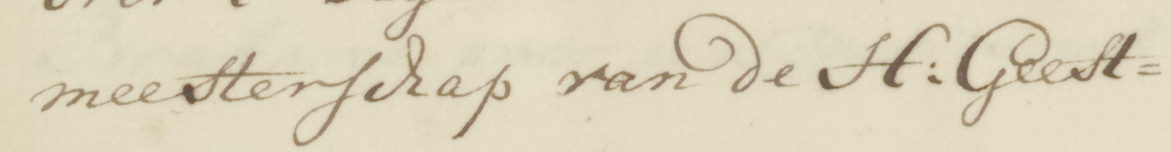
meesterschap van de H: Geest=
